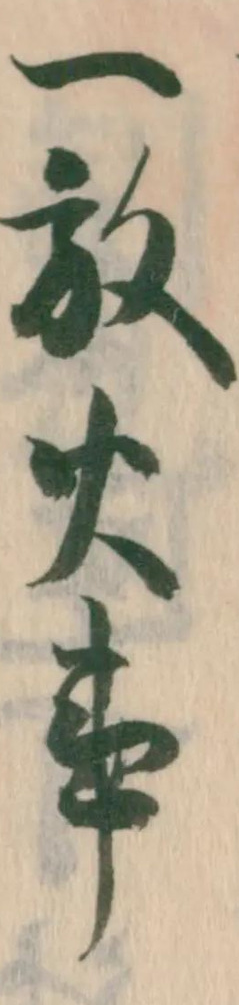一放火事
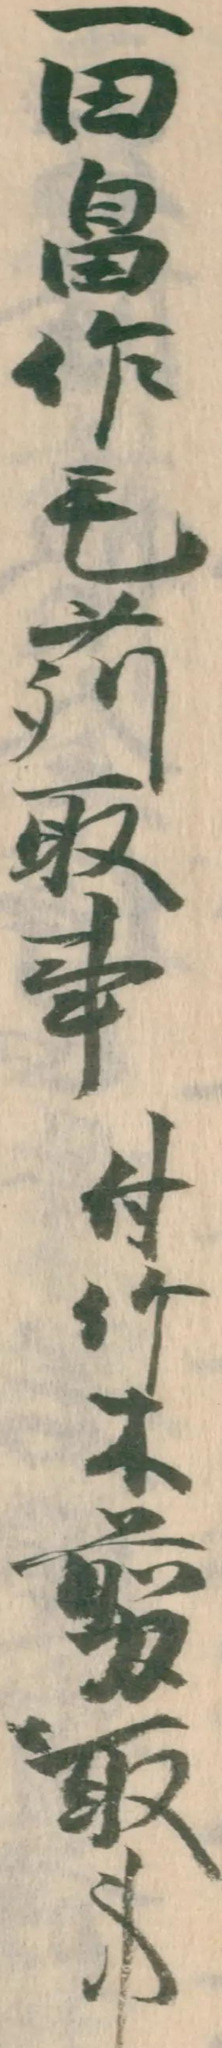一田畠作毛苅取事付竹木剪取事
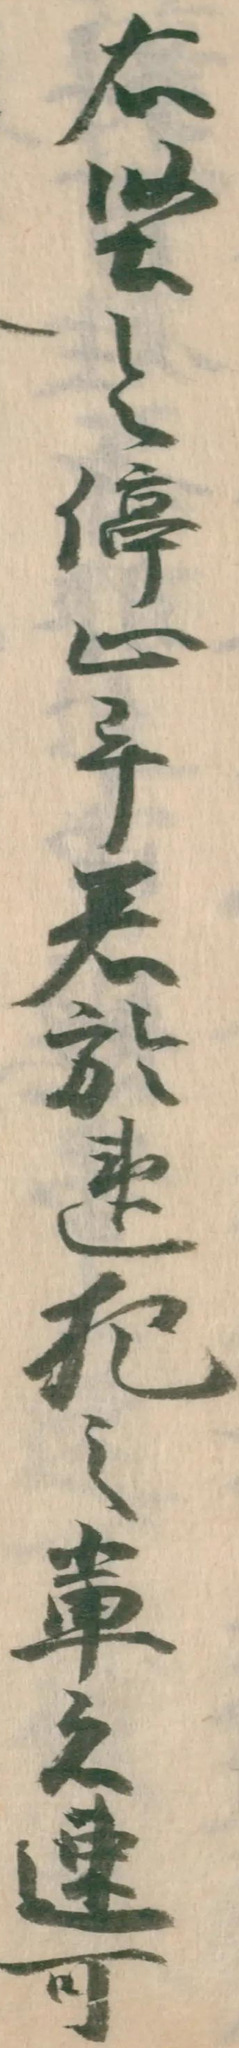右堅令停止畢若於違犯之輩者速可
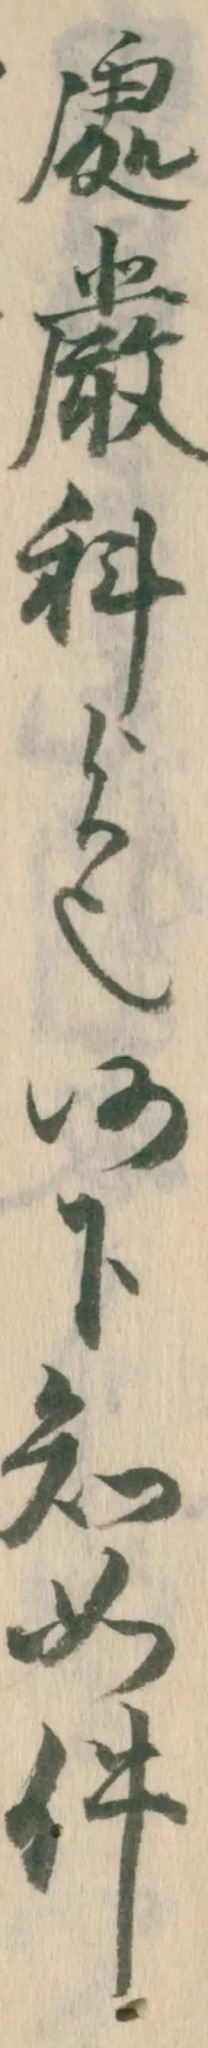処厳科者也仍下知如件

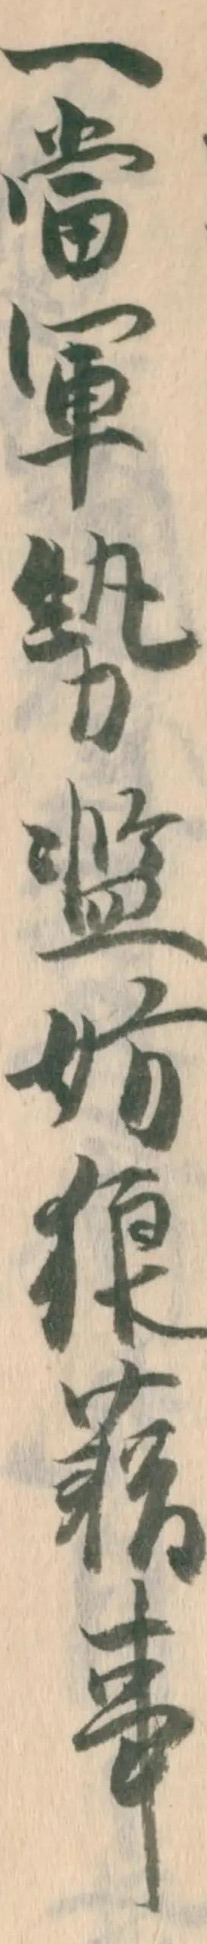一当軍勢濫妨狼藉事
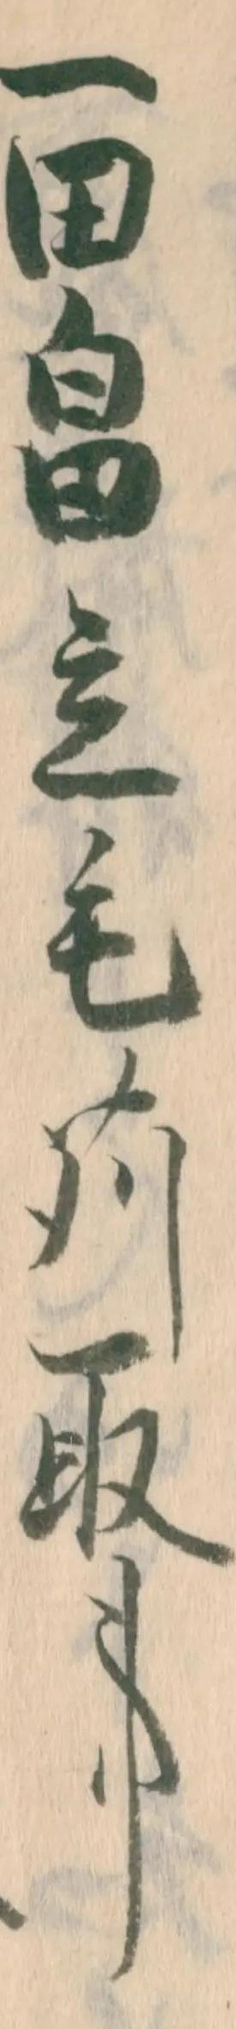一田畠立毛苅取事
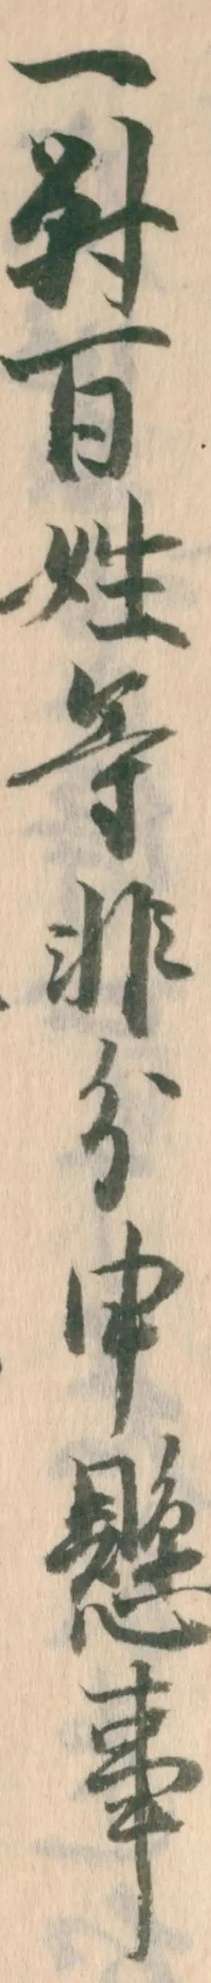一対百姓等非分申懸事
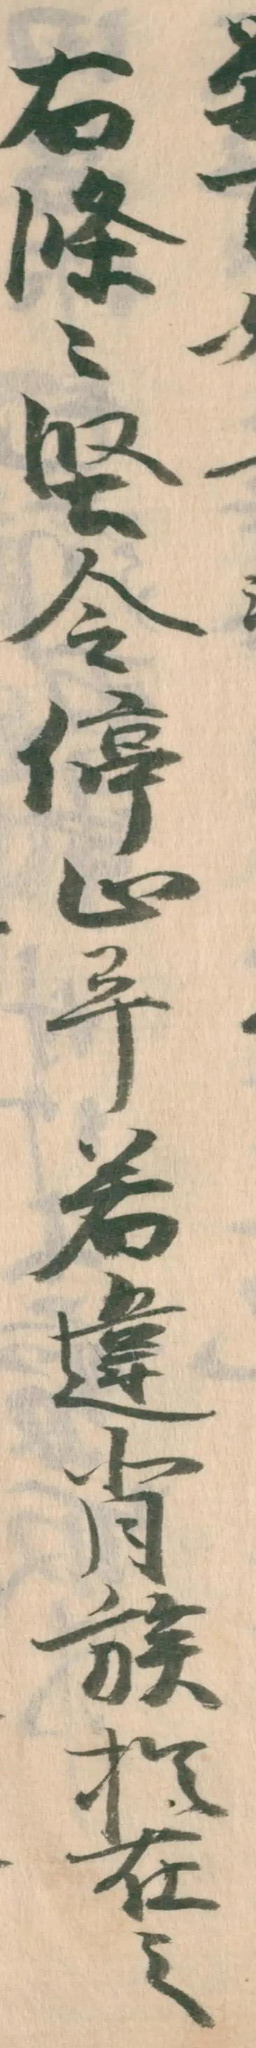右条々堅令停止畢若違背族於在之
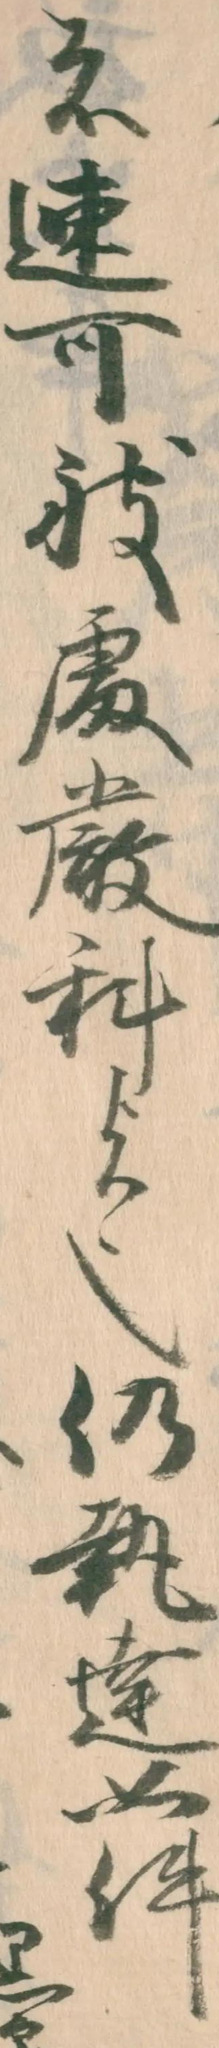者速可被処厳科者也仍執達如件
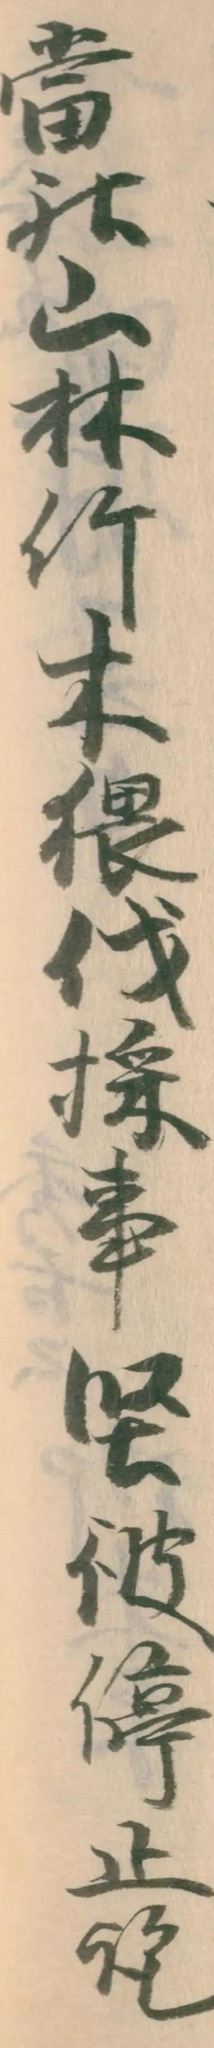当社山林竹木猥伐採事堅被停止訖
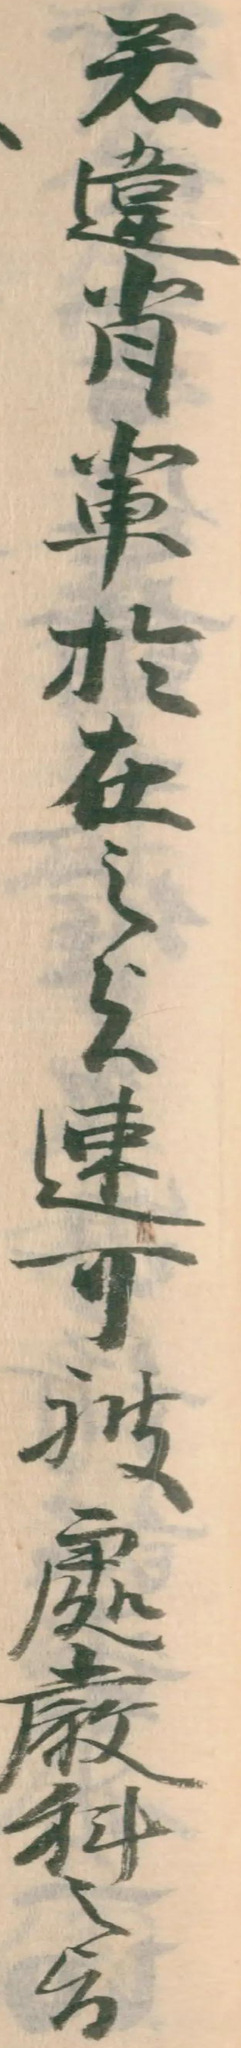若違背輩於在之者速可被処厳科之旨
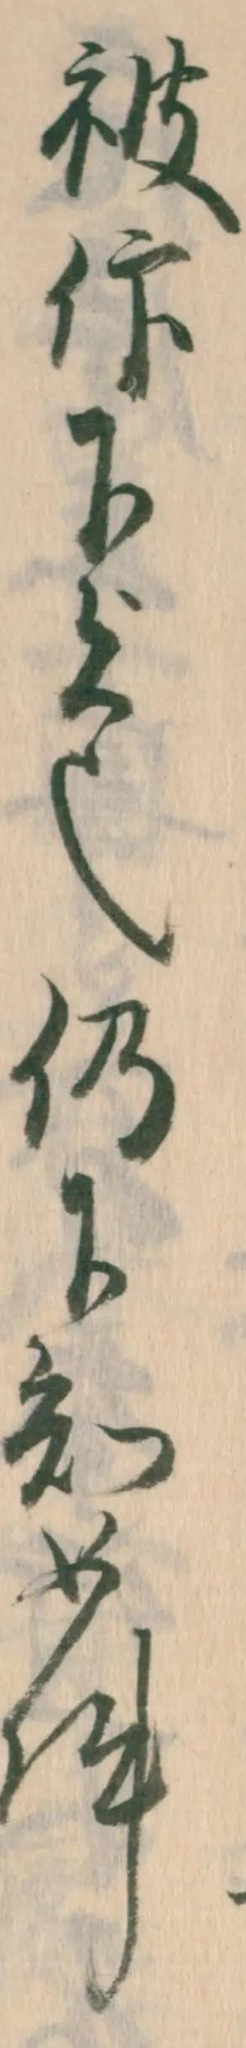被仰下者也仍下知如件
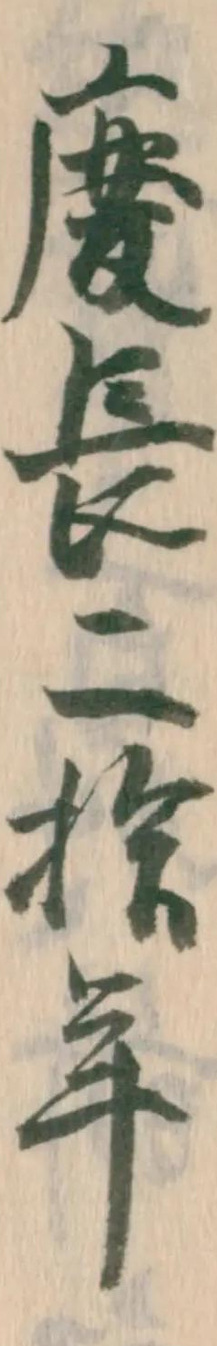慶長二拾年
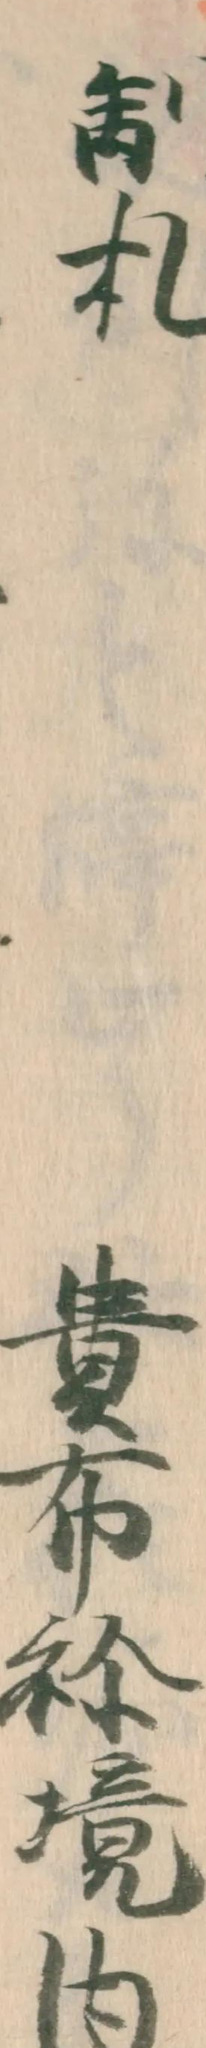制札貴ふね境内
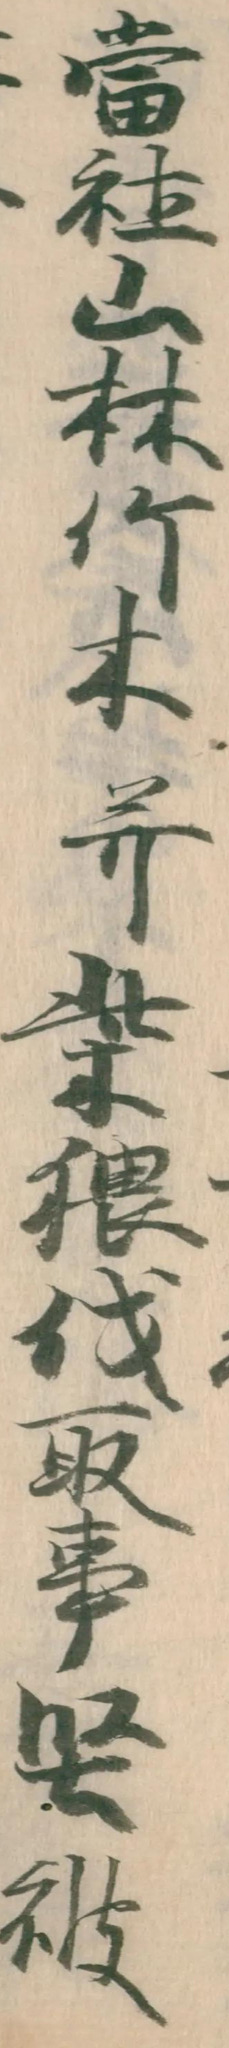当社山林竹木并柴猥伐取事堅被
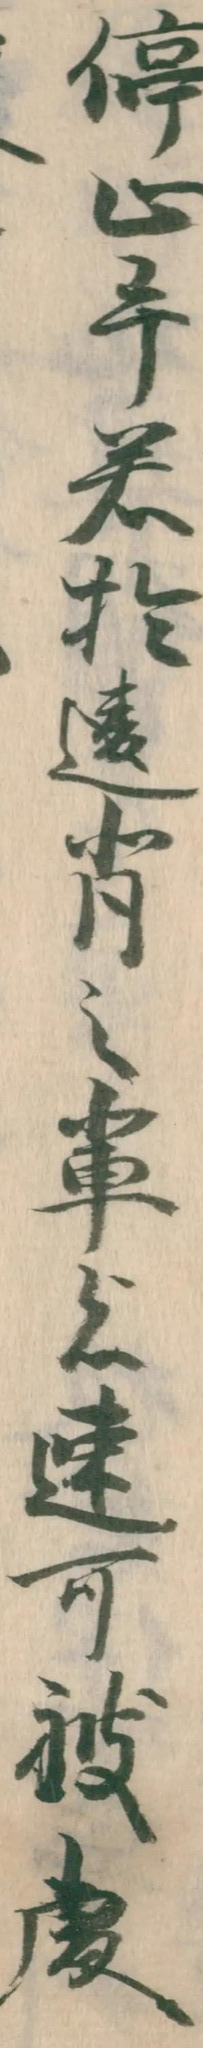停止畢若於違背之輩者速可被処
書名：賀茂社記録. 第1冊
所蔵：国立国会図書館 National Diet Library, JAPAN
